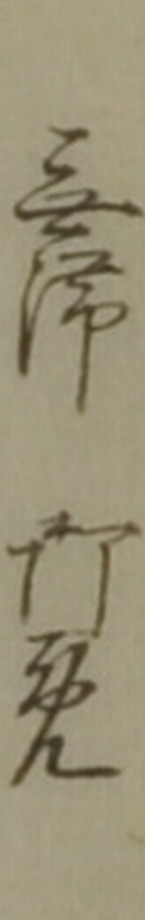無滞御免
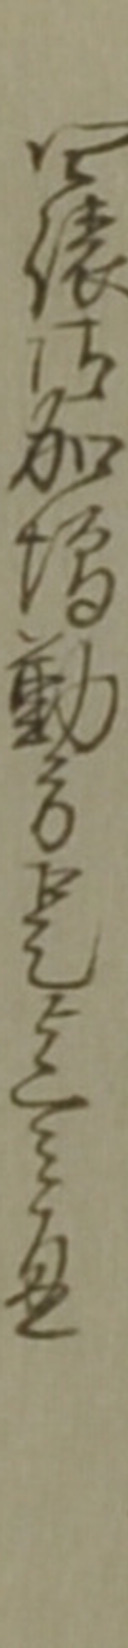四俵御加増勤方是迄之通
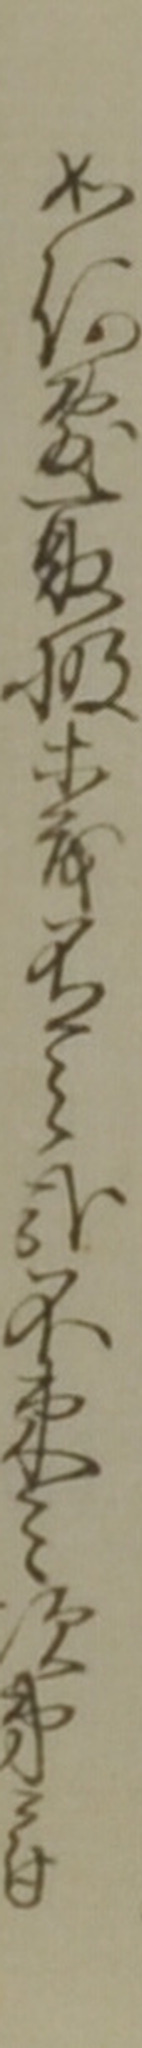如何敷取扱等茂有之哉不束之次第ニ付
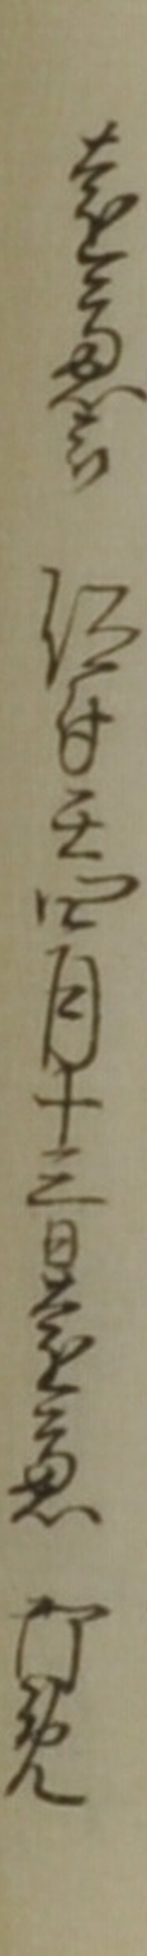遠慮被仰付閏四月十三日遠慮御免
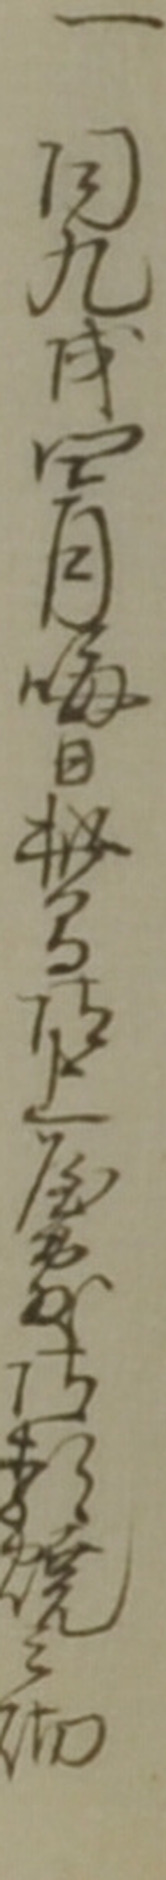一同九戌四月晦日此間御上屋敷御類焼之砌
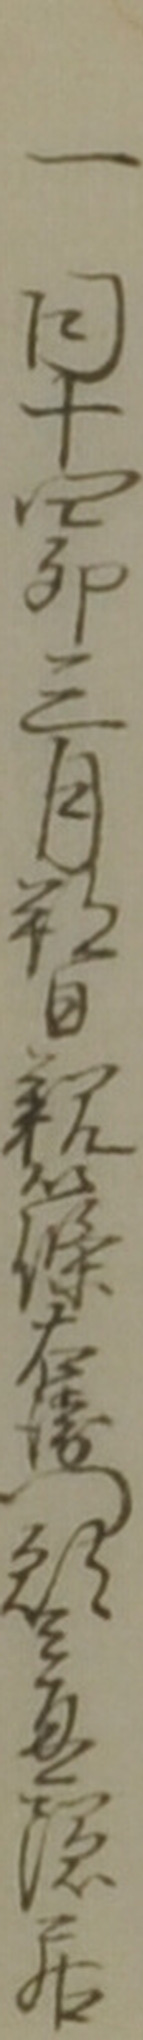一同十四卯三月朔日親篠右衛門願之通隠居
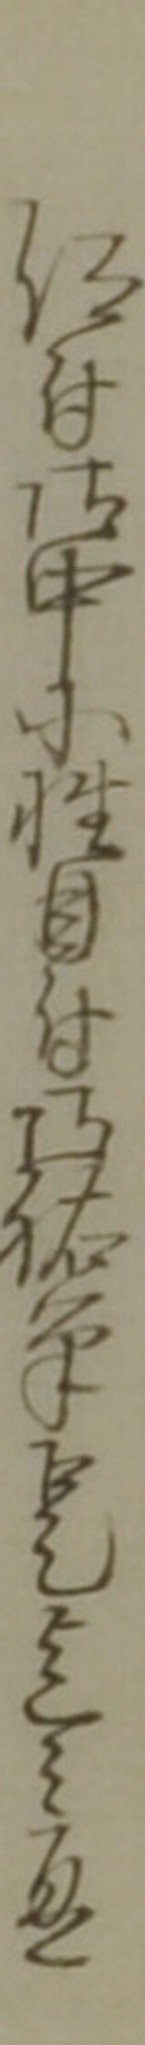仰付御中小性目付御祐筆是迄之通
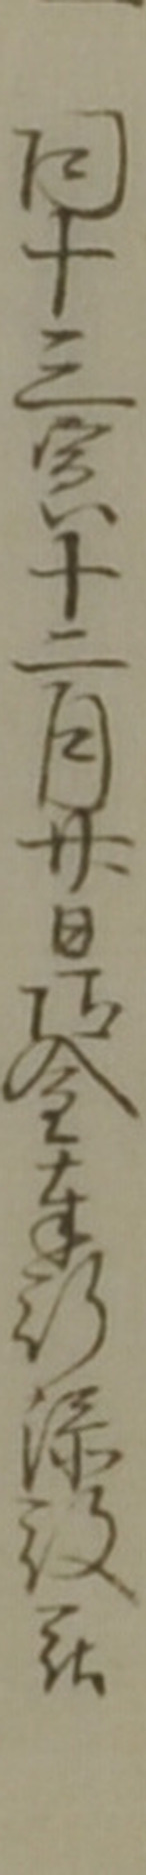一同十三寅十二月廿日御金奉行添役被
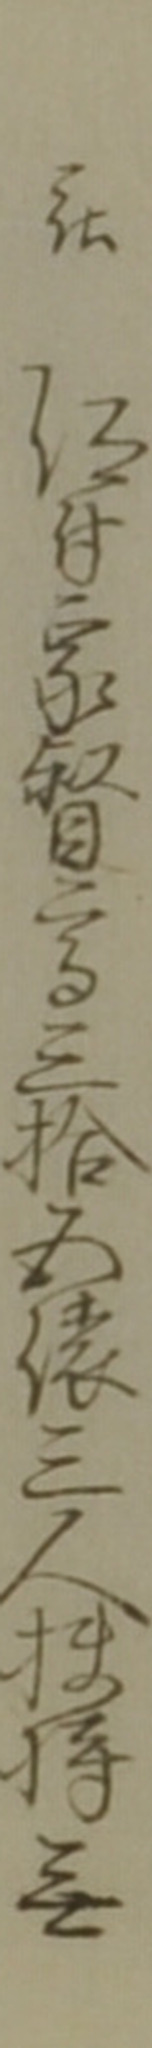被仰付家督高三拾五俵三人扶持無
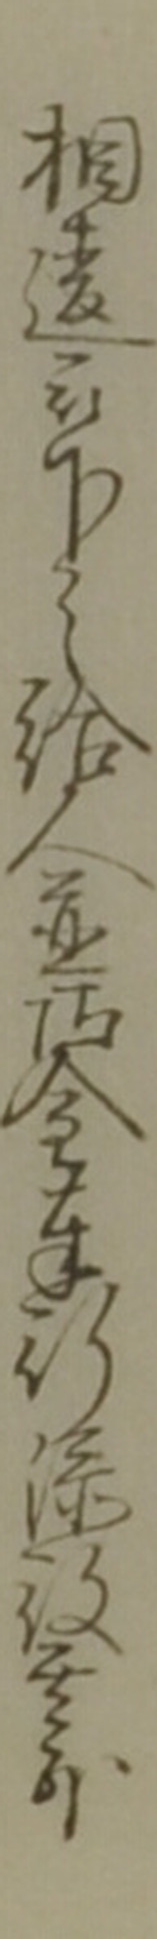相違被下之給人並御金奉行添役其外
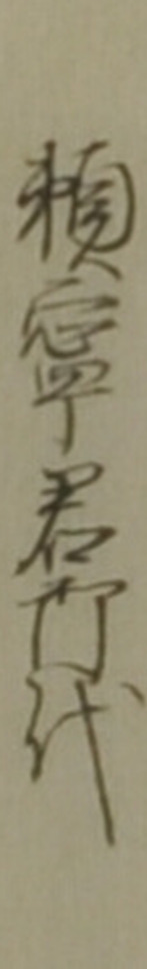頼寧君御代
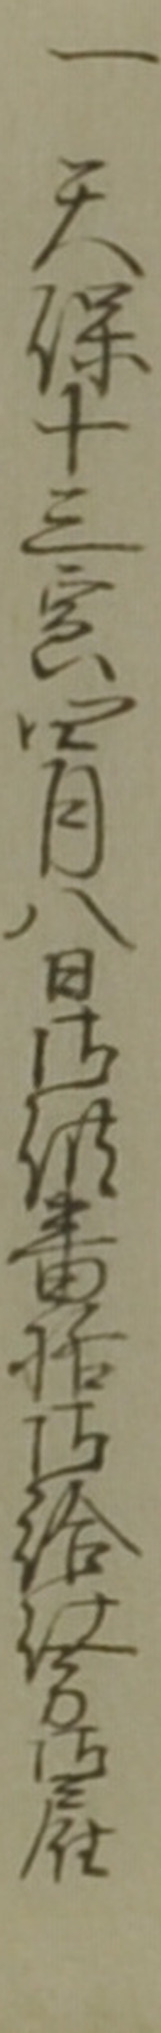一天保十三寅四月八日御供番格御給仕方御雇
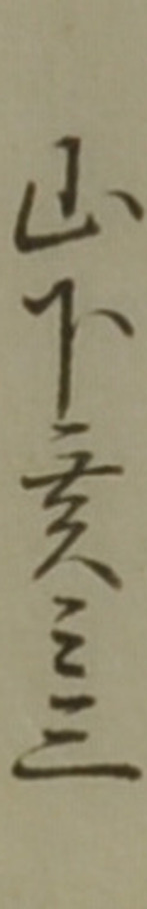山下亥之三
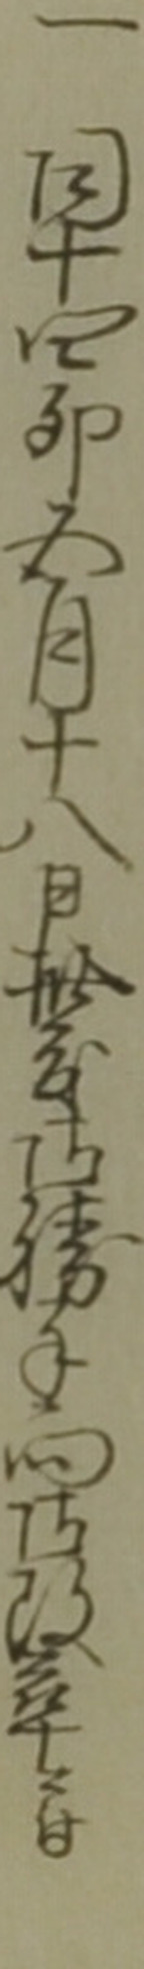一同十四卯五月十八日此度御勝手向御改卒ニ付
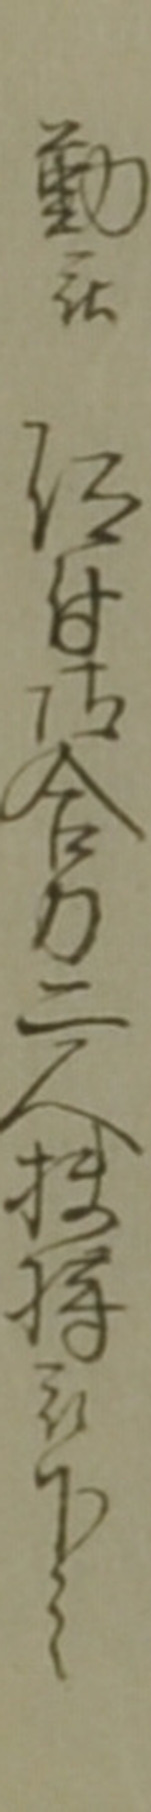勤被仰付御合力二人扶持被下之
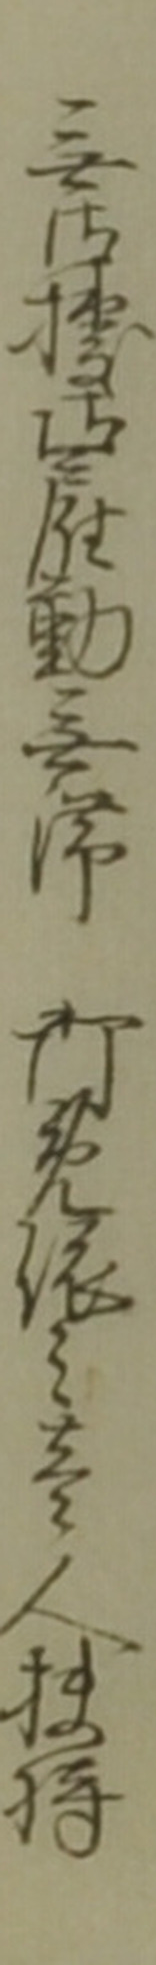無御拠御雇勤無滞御免依之壱人扶持
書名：無足廃家（弐）
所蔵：伊那市立高遠町図書館・合同会社AMANE
